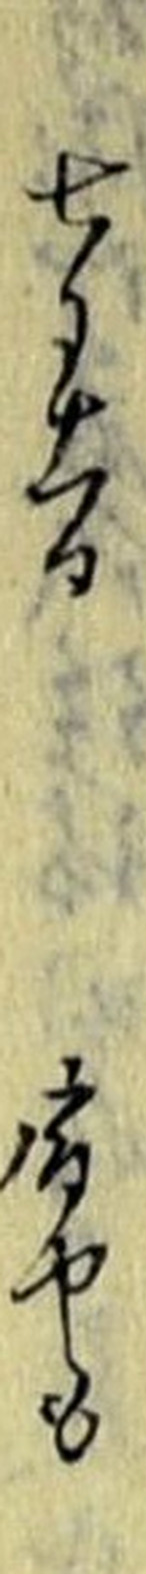七月十一日府中へも
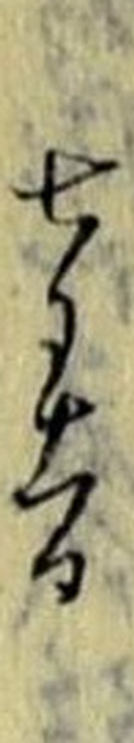七月十一日

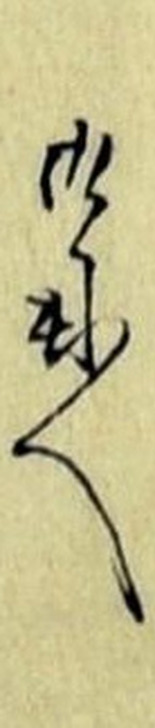御用人
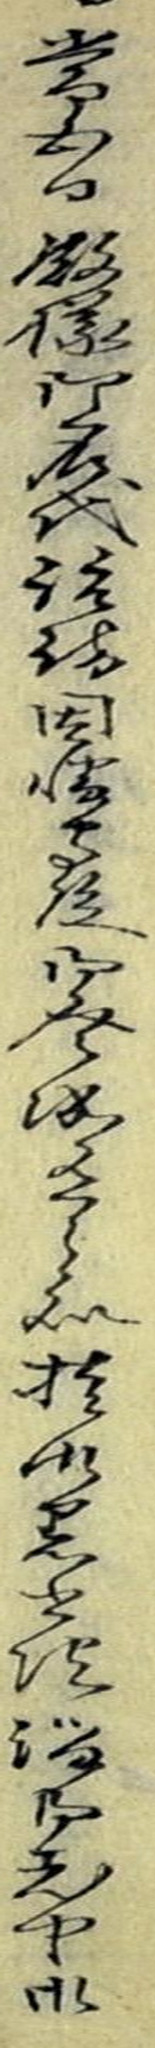○当五日殿様御名代諏訪因幡守殿御登城有之候処於御黒書院溜御老中御
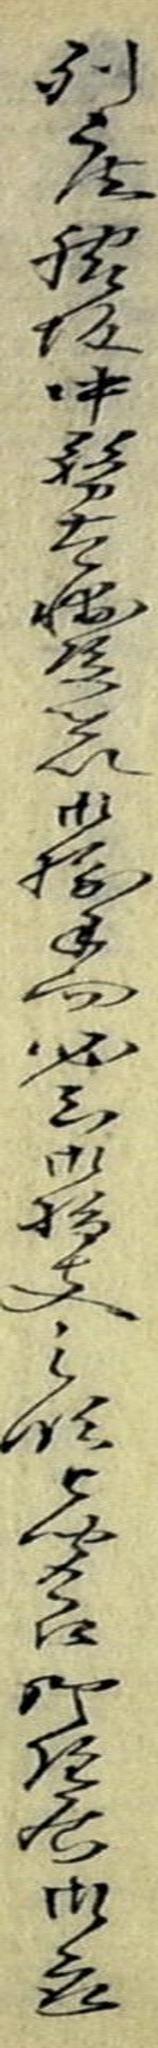列座脇坂中務太輔殿を以御勝手向必至御指支之段被聞節御住居御取
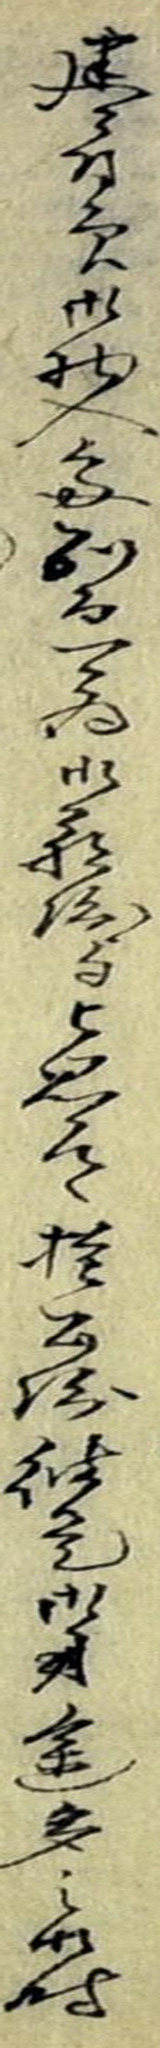建ニ付而ハ御物入多別而可為御難儀与被思召候於公儀彼是御用途多之御時
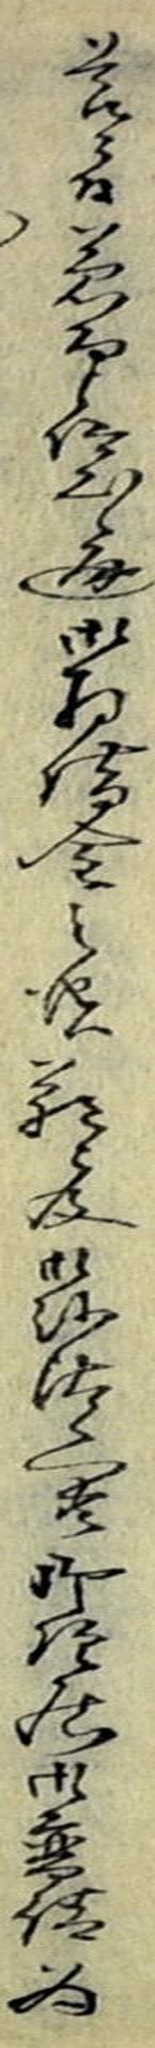節ニ付兼而之仰出之通御拝借金之儀ハ難被及御沙汰候へ共御住居御普請為
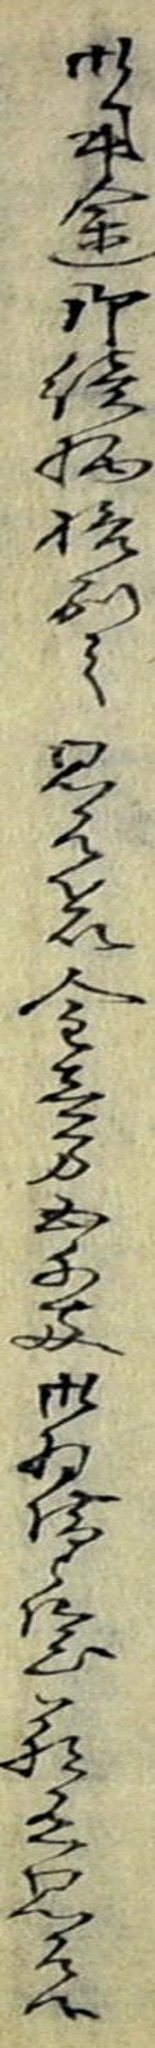御用途御続柄格別之思召を以金壱万五千両御拝借被仰出難有思召候
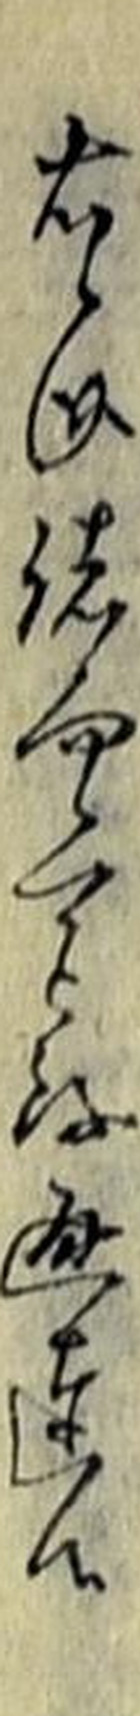右之趣諸向可被致通達候
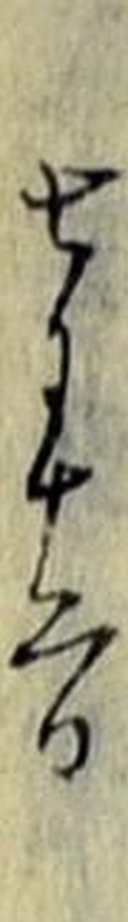七月十二日
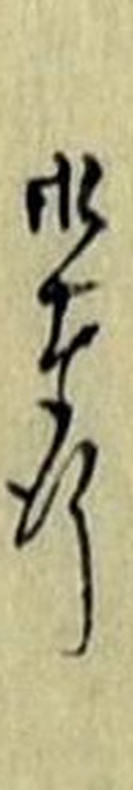御奉行
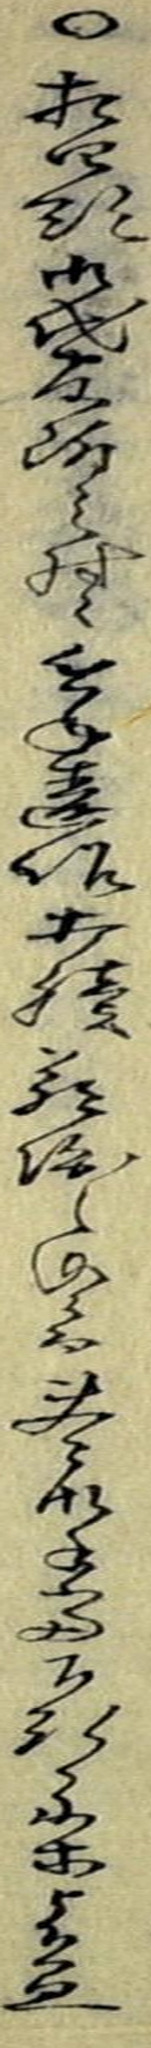○相四郡御代官所之村々近年違作打続難儀之趣ニ而夫々御手当下行米等被下置
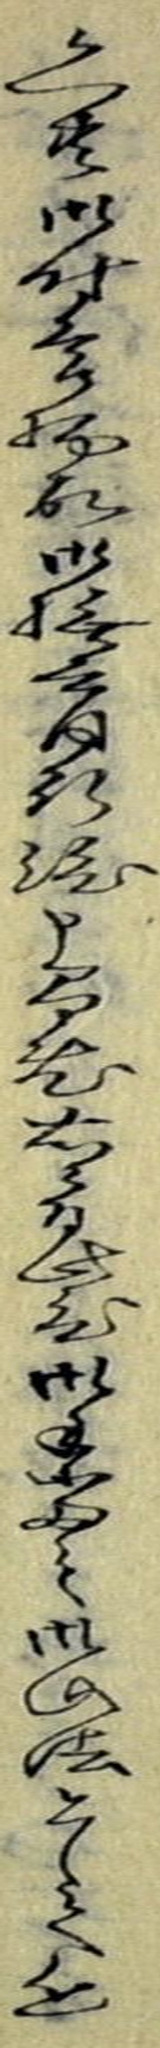候へ共御時節柄故御撫育行渡申間敷右ニ付此度御手当之御趣法として近
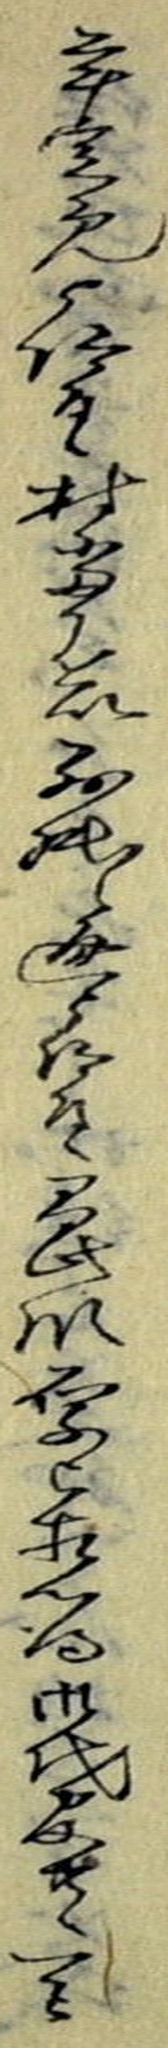年定免被仰付候村当りを以別紙之通被仰付候間此段厚被相心得御代官共へ可被
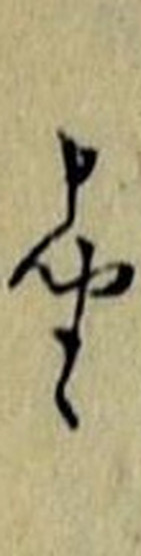申聞候
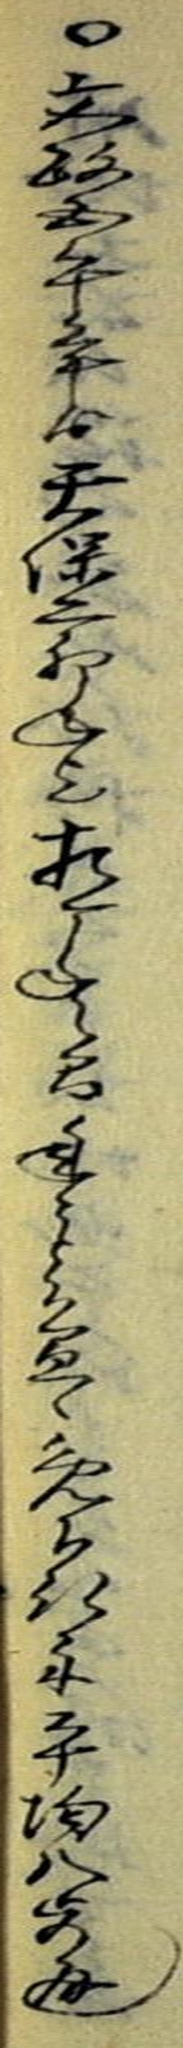○文政五午年ゟ天保二卯年迄拾ケ年之間年々被下置候免下行米平均八歩通
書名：命令之部 五
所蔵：福井県文書館 Fukui Prefectural Archives
